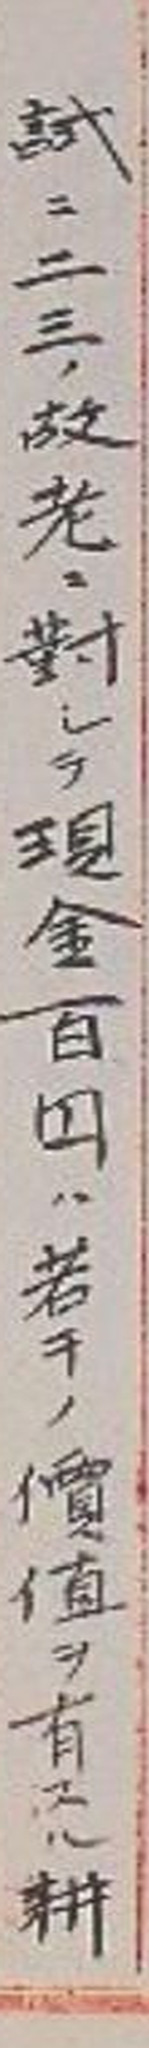試ニ二三ノ故老ニ対シテ現金百円ハ若干ノ価値ヲ有スル耕
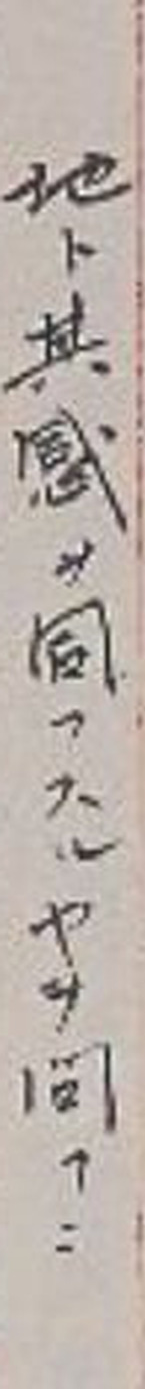地ト其感ヲ同フスルヤヲ問フニ
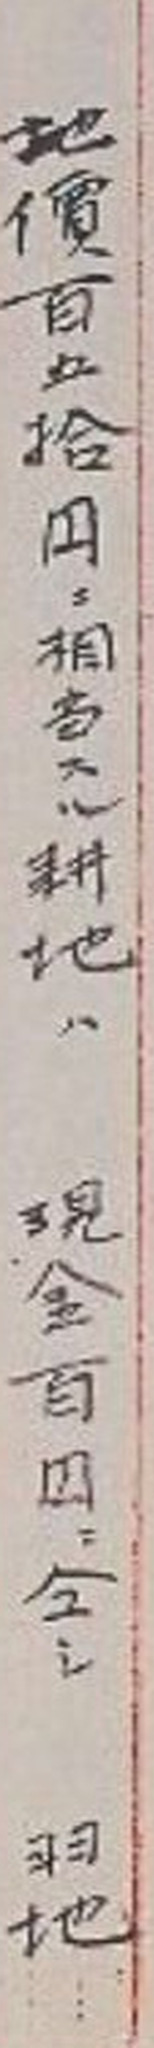地価百五拾円ニ相当スル耕地ハ現金百円ニ仝シ羽地
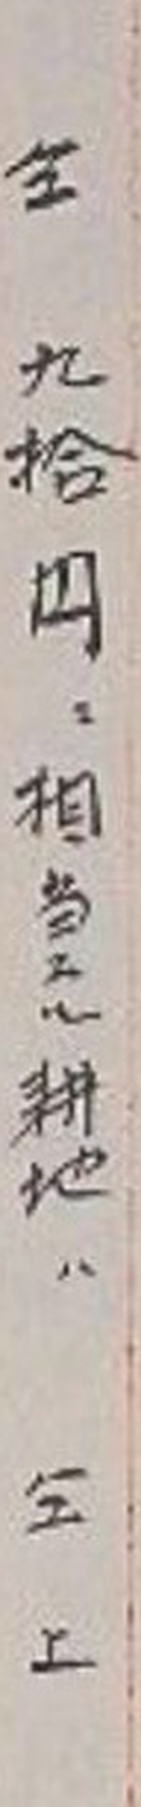仝九拾円ニ相当スル耕地ハ仝上中城
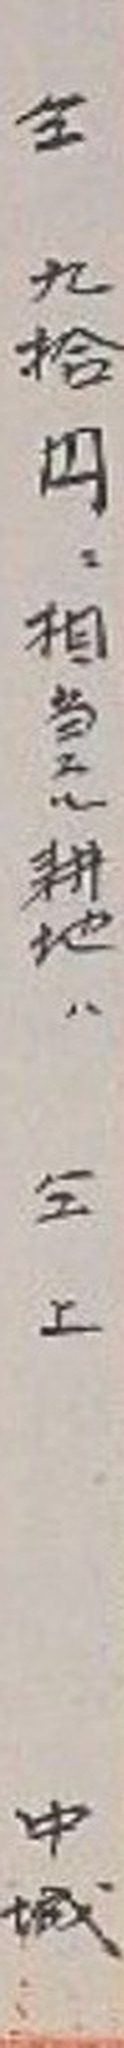仝九拾円ニ相当スル耕地ハ仝上中城
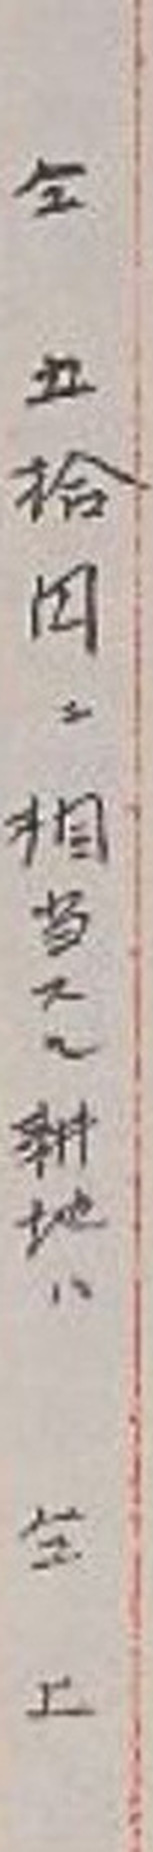仝五拾円ニ相当スル耕地ハ仝上兼城
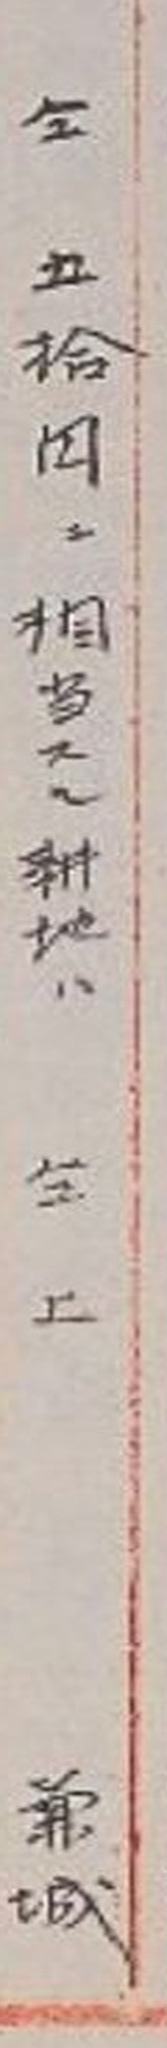仝五拾円ニ相当スル耕地ハ仝上兼城
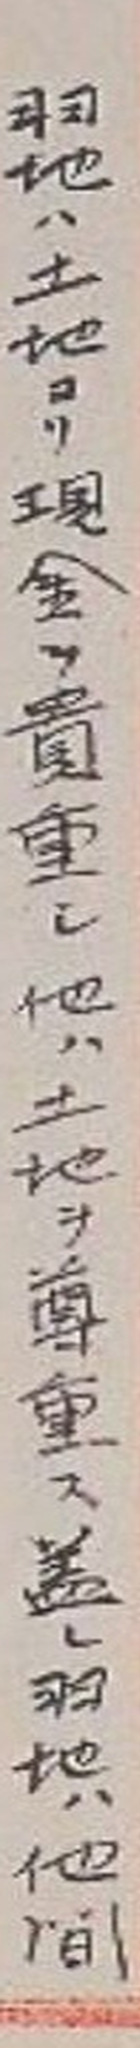羽地ハ土地ヨリ現金ヲ貴重シ他ハ土地ヲ尊重ス蓋シ羽地ハ他間
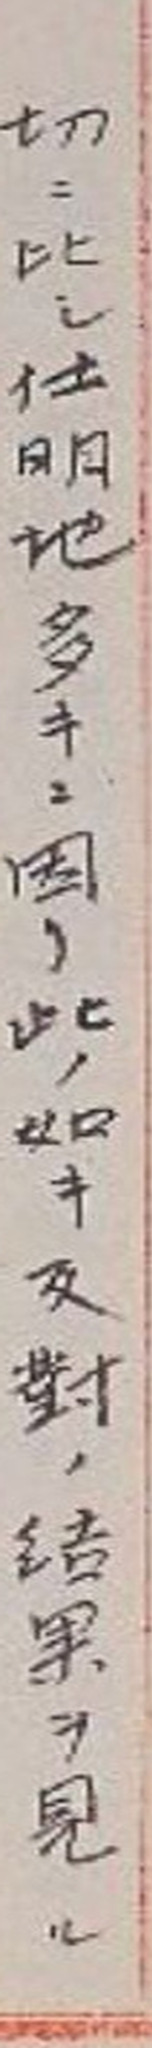切ニ比シ仕明地多キニ因リ此ノ如キ反対ノ結果ヲ見ル
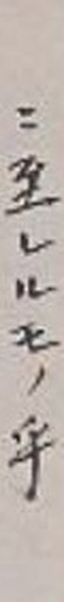ニ至レルモノ乎
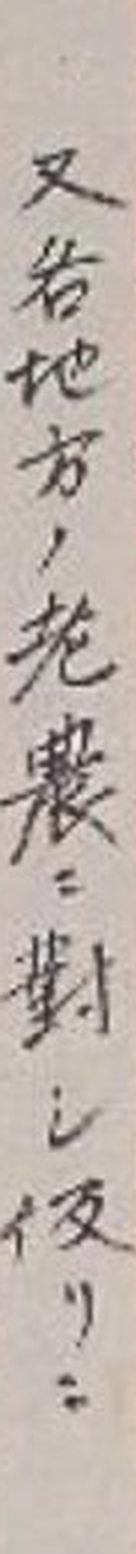又各地方ノ老農ニ対シ仮リニ
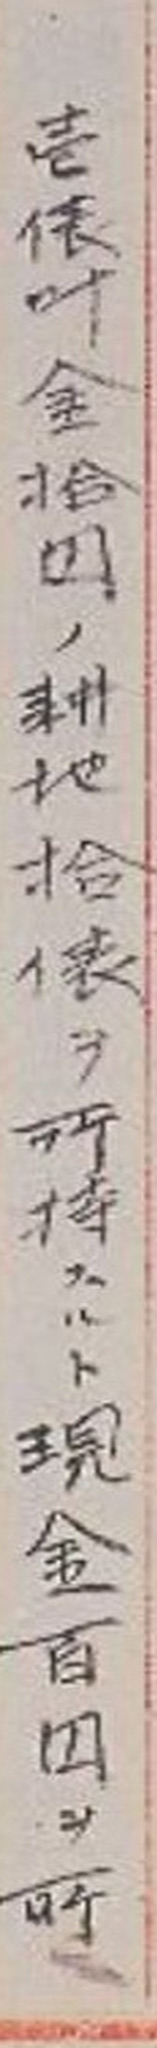壱俵叶金拾円ノ耕地拾俵ヲ所持スルト現金百円ヲ所
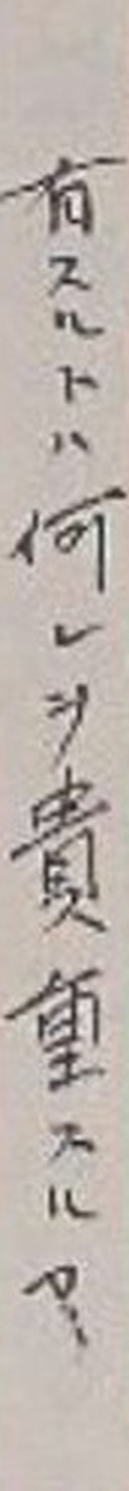有スルトハ何レヲ貴重スルヤ
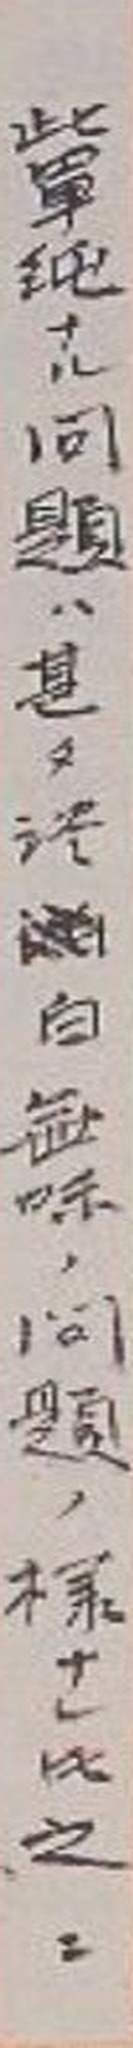此単純ナル問題ハ甚タ淡白無味ノ問題ノ様ナレトモ之ニ
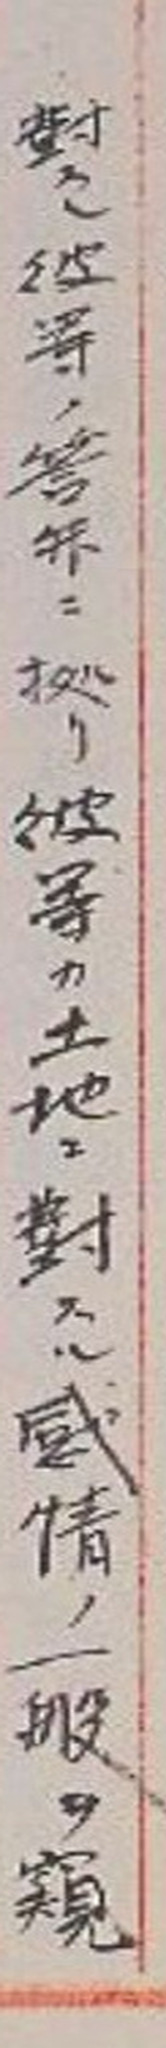対スル彼等ノ答弁ニ拠リ彼等カ土地ニ対スル感情ノ一般ヲ窺
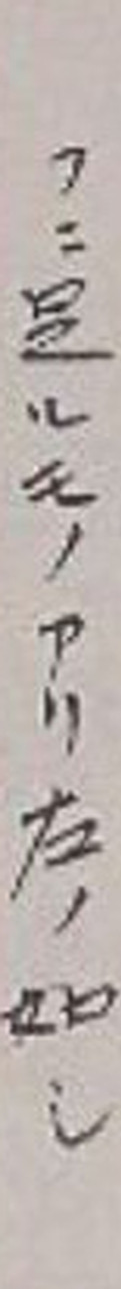フニ足ルモノアリ左ノ如シ
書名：本県地価ノ高キ理由調書
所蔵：University of the Ryukyus Library
